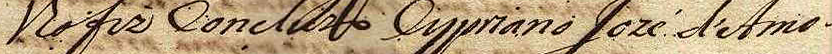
lho fiz Concluzo Cypriano Jozé d'Amo
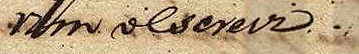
rim o escrevi.
